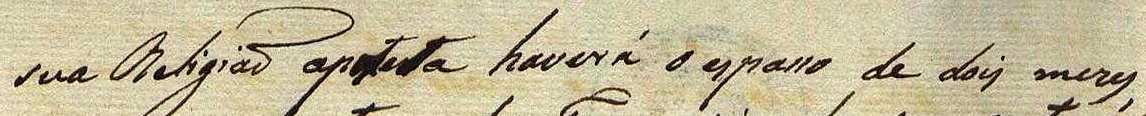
sua Religiaõ apoteta haverá o espasso de dois mezes,
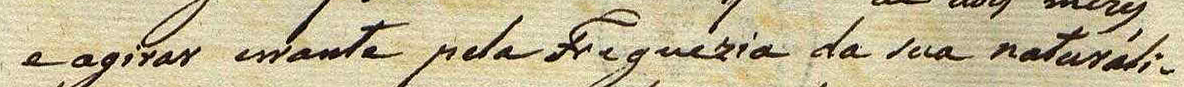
e a girar errante pela Freguezia da sua naturali
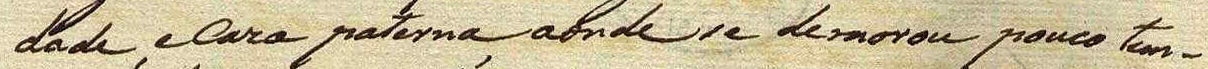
dade, e caza paterna, aonde se demorou pouco tem
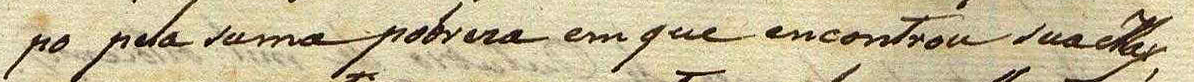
po pela suma pobreza em que encontrou sua May,
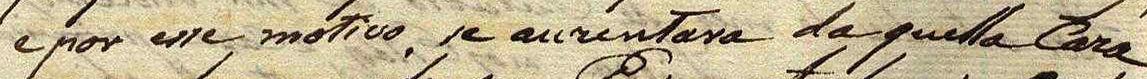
e por esse motivo, se auzentara daquella Caza,
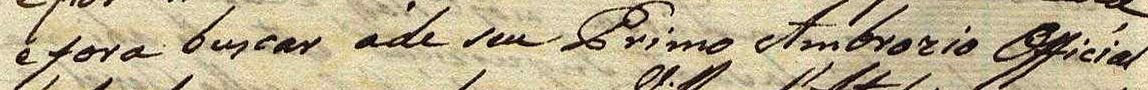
e fora buscar a de seu Primo Ambrozio Official
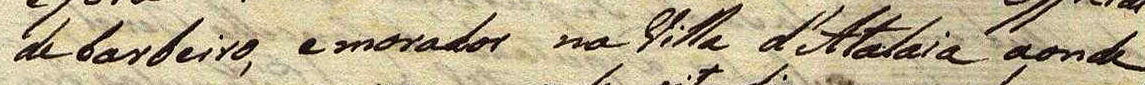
de barbeiro, e morador na Villa d'Atalaia aonde
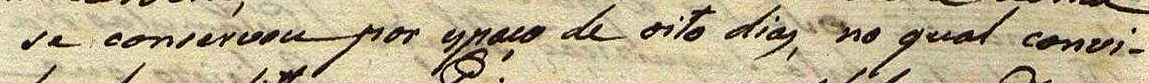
se conservou por espaço de oito dias, no qual convi
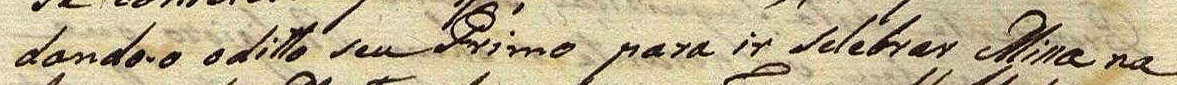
dando-o o ditto seu Primo para ir selebrar, Missa na
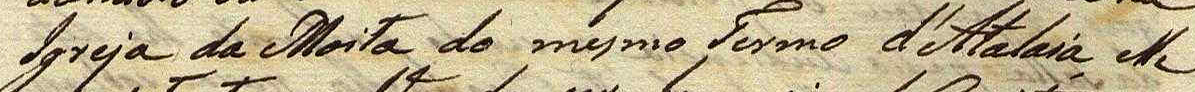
Igreja da Moita do mesmo Termo d'Atalaia, elle
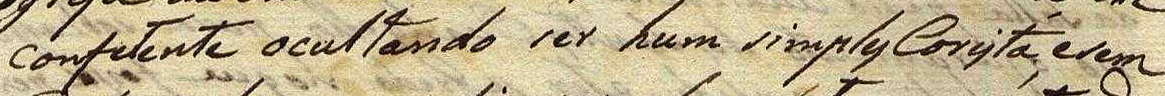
confitente ocultando ser hum simples Corista, e sem
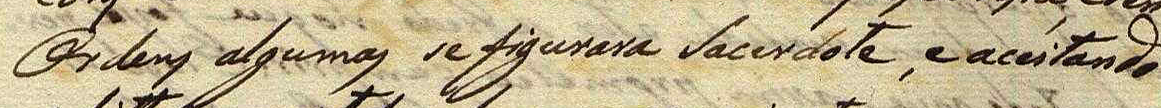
Ordens algumas se figurara Sacerdote, e aceitando
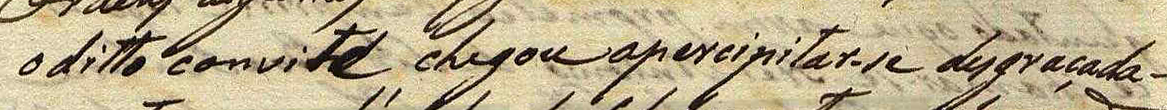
o ditto convite, chegou a percipitar-se desgraçada
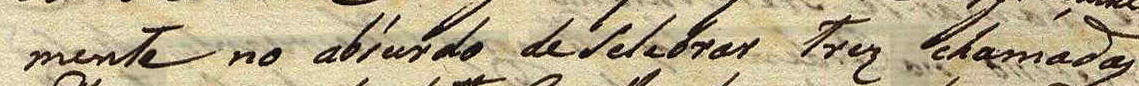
mente no absurdo de selebrar trez chamadas
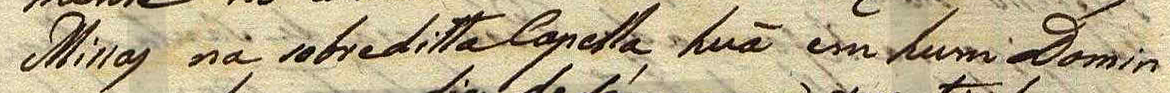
Missas na sobreditta Capella, huā em hum Domin
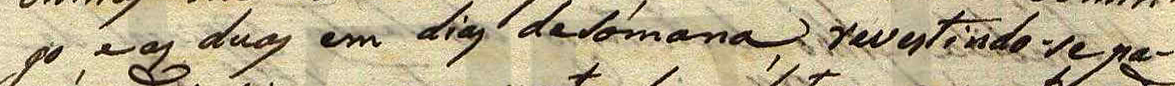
go e as duas em dias da somana, revestindo-se pa
